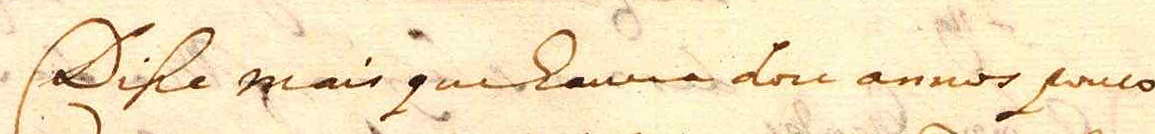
Disse mais que hauera doz annos pouco
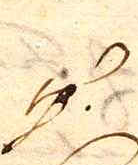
tp.o
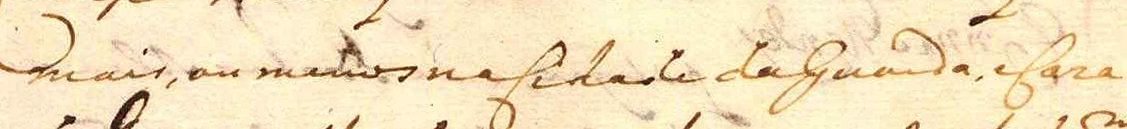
mais, ou menos na Cidade da Guarda, e Caza
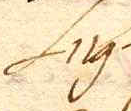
Lug.
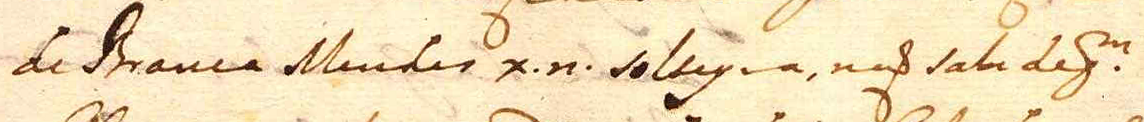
de Branca Mendes x. n. solteyra, naõ sabe de q.m
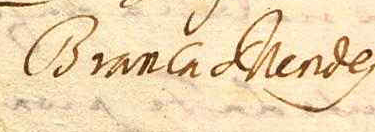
Branca Mendes
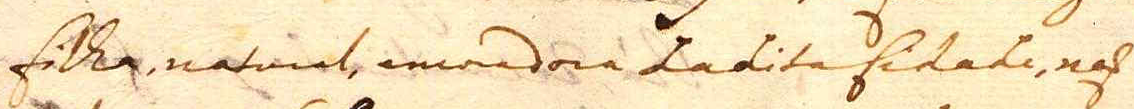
filha, natural, e moradora da dita Cidade, naõ
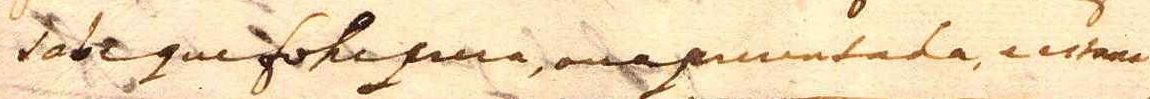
sabe que fosse preza, ou aprezentada, e estaua
